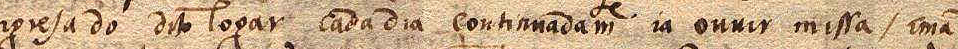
igreja do dit̄o logar cada dia continuadamte ia ouuir missa / E mā
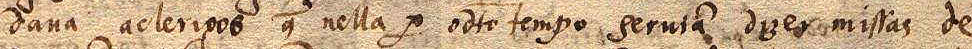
daua a clerigos q̄ nella ꝑ o dt̄o tempo Seruiā dizer missas de
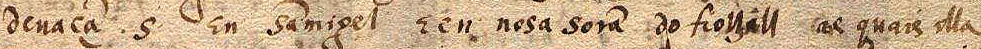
deuaçā .S. En Sā migel E en nosa sorā do fiolhall as quais ella
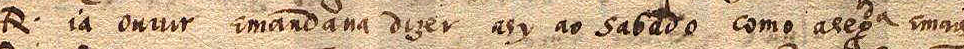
R. ia ouuir E mandaua dizer asy ao Sabado como a segda E mais
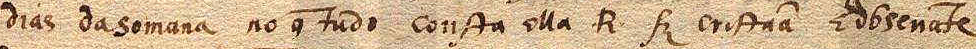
dias da somana no q̄ tudo Consta ella R sz cristaā E obseuāte
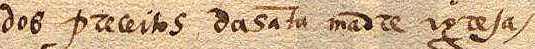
dos preceitos da s̄ata madre igreJa /
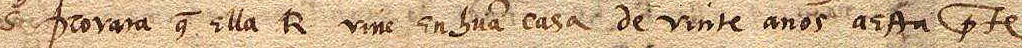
Provara q̄ Ella R viue En huā casa de vinte anos̄ a Esta p̄te
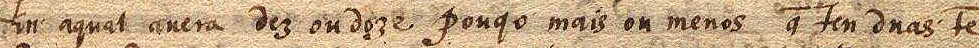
En a qual auera dez ou doze pouqo mais ou menos q̄ ten duas tē
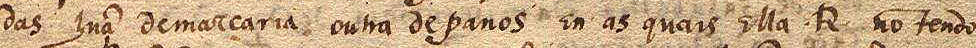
das huā de marçaria outra de panos En as quais Ella .R. nō tendo
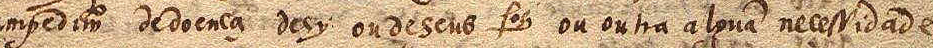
impedimto de doença de sy ou de seus fos ou outra alguā neçessidade
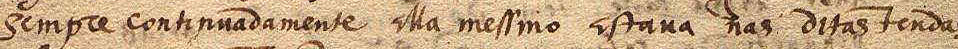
Sempre continuadamente Ella messmo Estaua nas ditas tendas
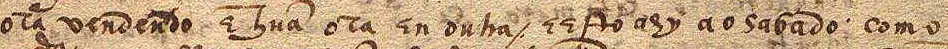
ora vendendo Ē huā ora En outra / E Esto asy ao sabado. como
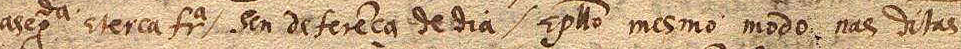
a segda E terca fra / sen deferēça de dia / E p̄llo mesmo modo. nas ditas
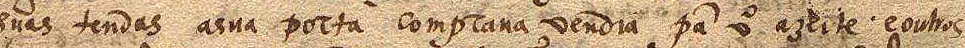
suas tendas a sua porta compraua vendia pā vo azeite. e outros
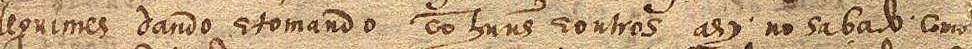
leguimes dando E tomando c̄o huūs E outros asy no sabado como
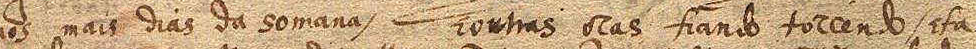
nos mais dias da somana / E outras oras fiando torçendo / E fa
